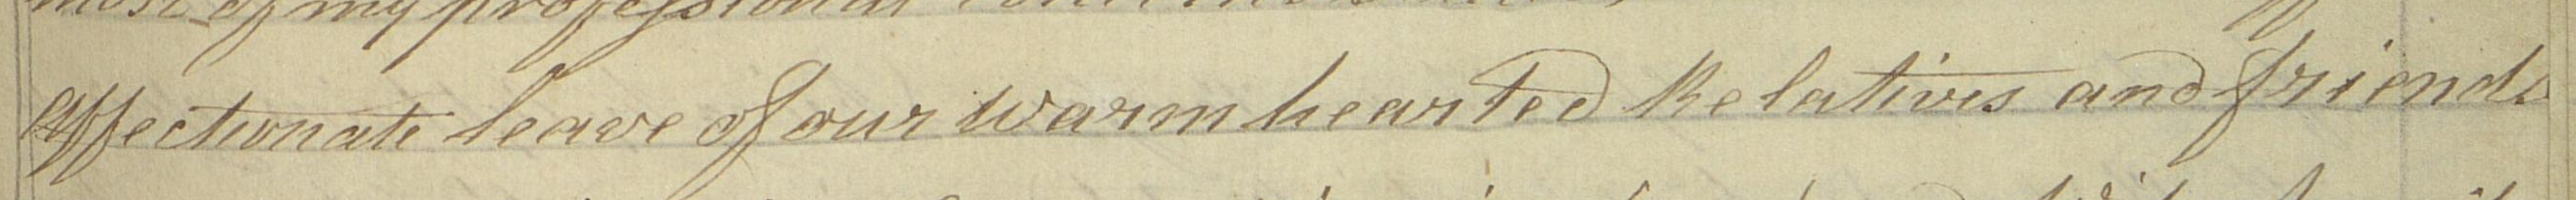Affectionate Leave of our warm hearted Relatives and friends
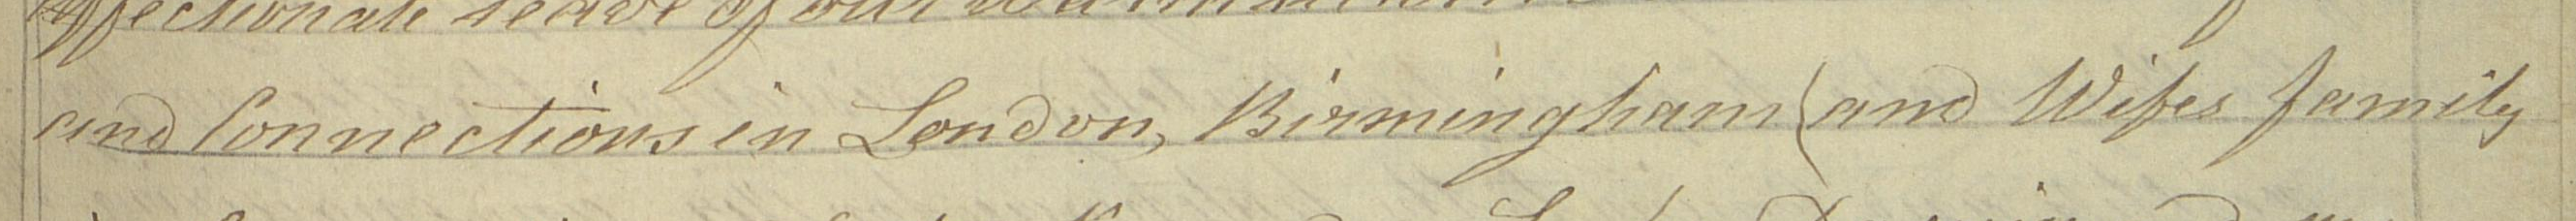and Connections in London, Birmingham (and Wifes family
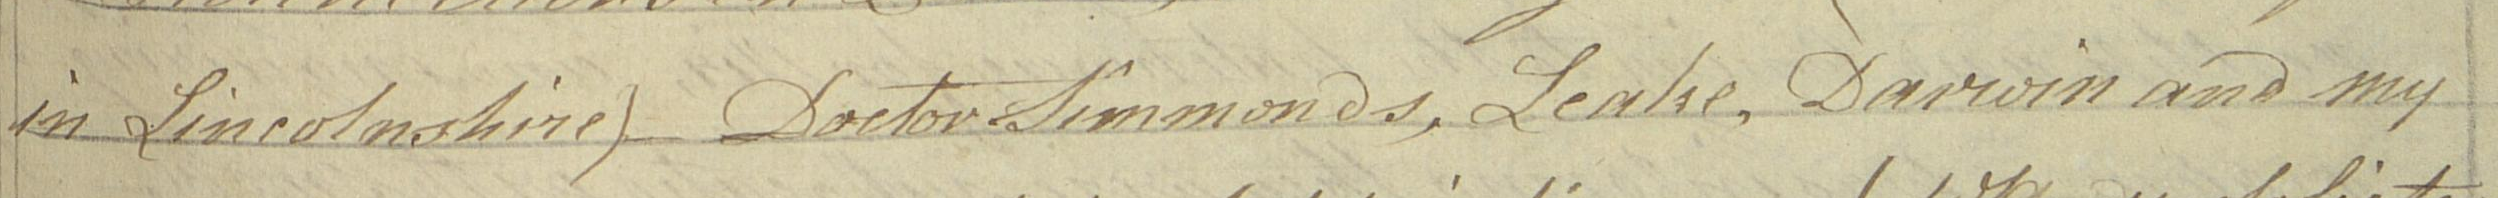in Lincolnshire) Doctor Simmonds, Leake, Darwin and my
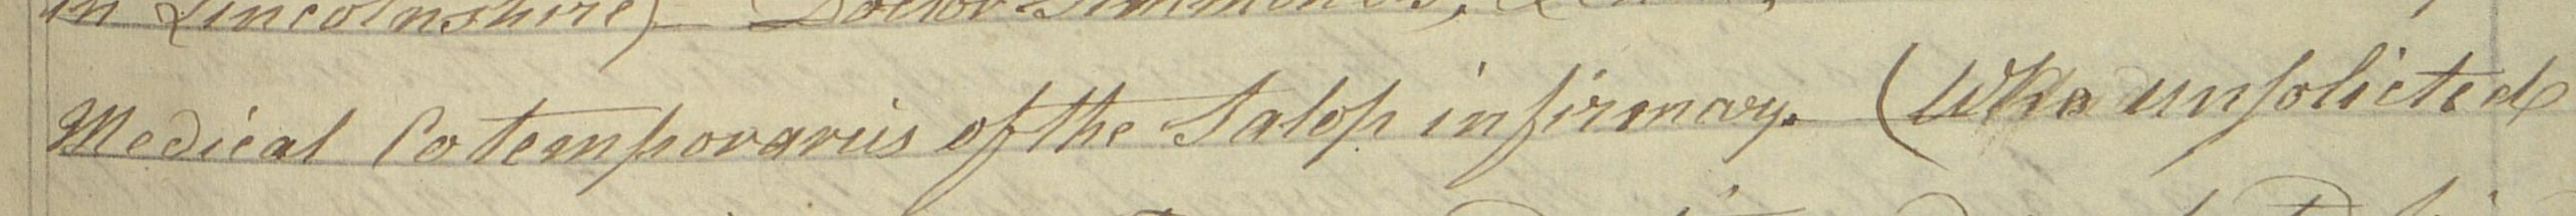Medical Cotemporaries of the Salop infirmary. (Who unsolicited
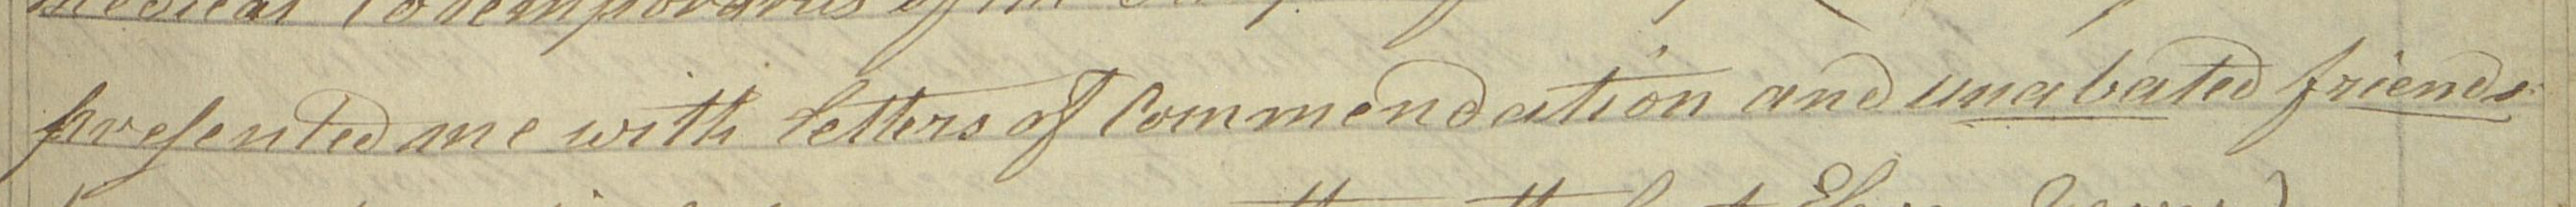presented me with letters of Commendation and unabated friends
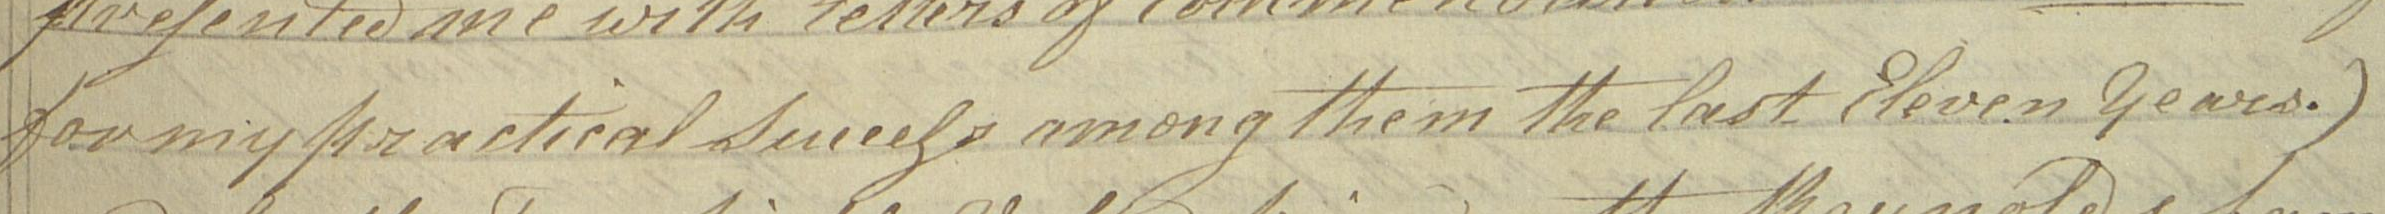for my practical Success among them the last Eleven Years.)
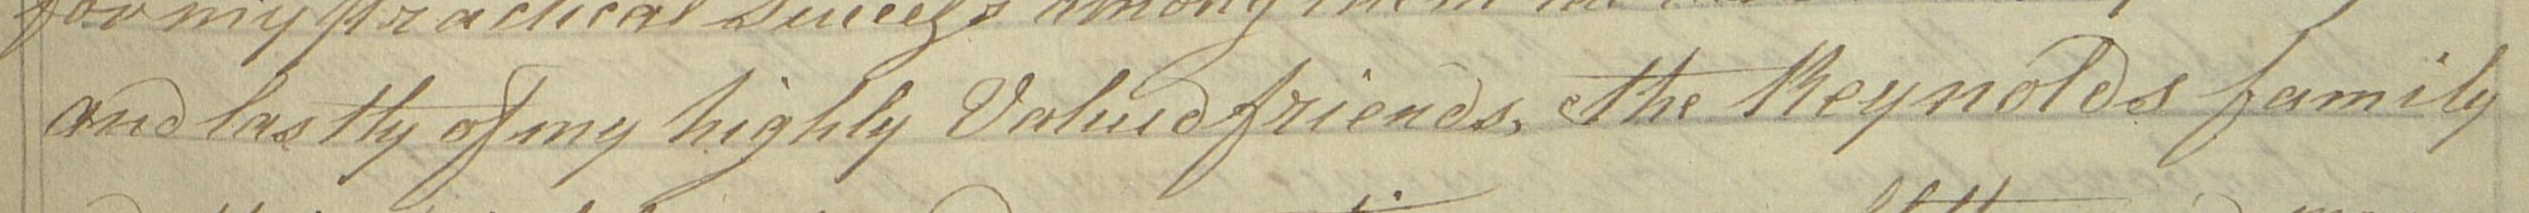and lastly of my highly Valued friends, the Reynolds family
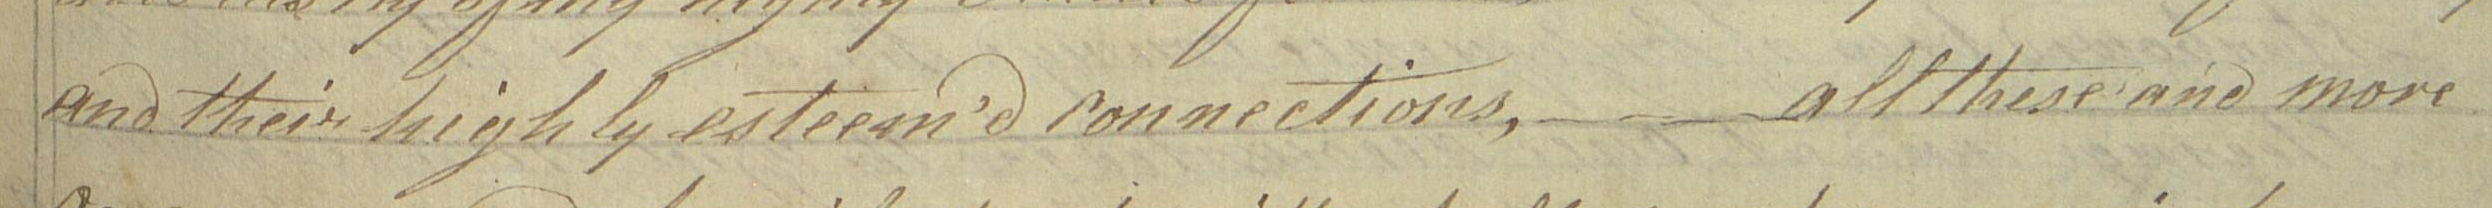and their highly esteem'd connections, All these and more
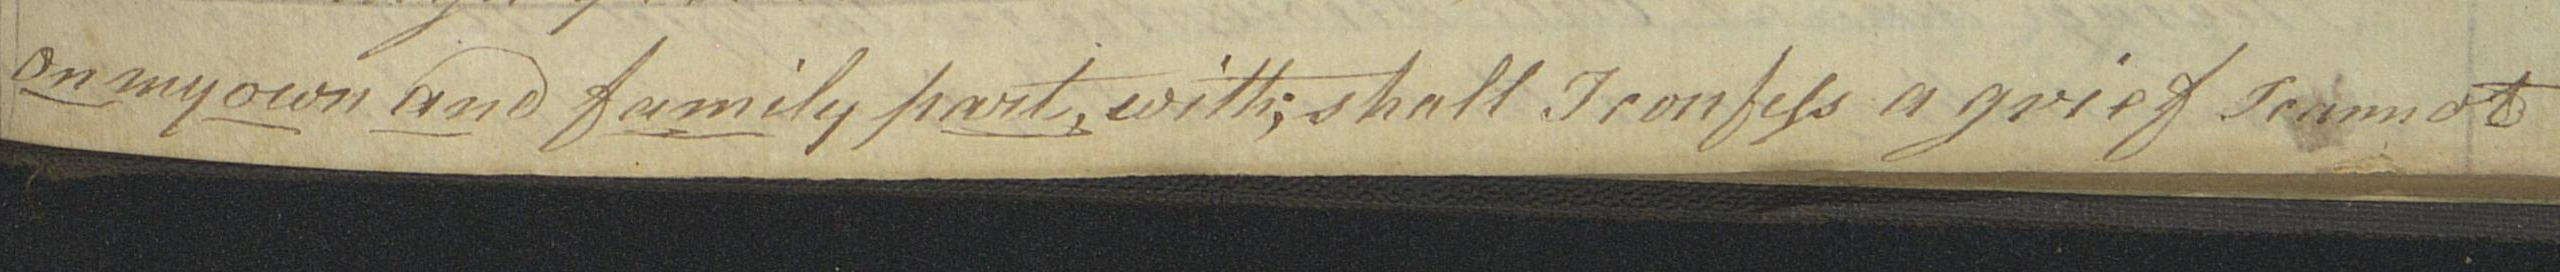on my own and family part, with; shall I confess a grief I cannot
